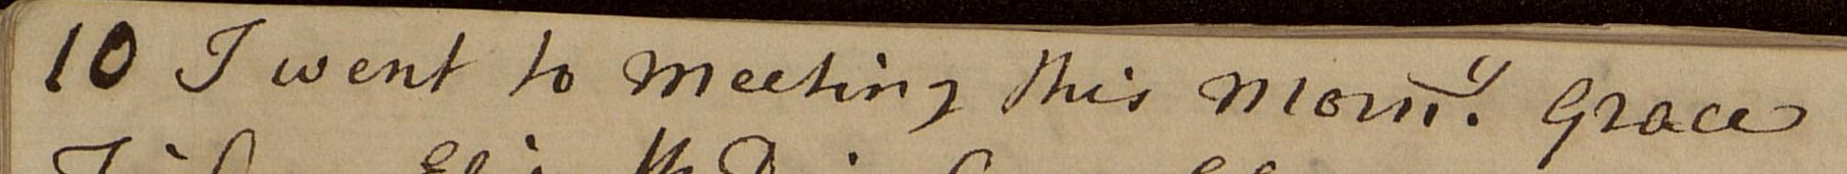10 I went to meeting this morn^g. Grace
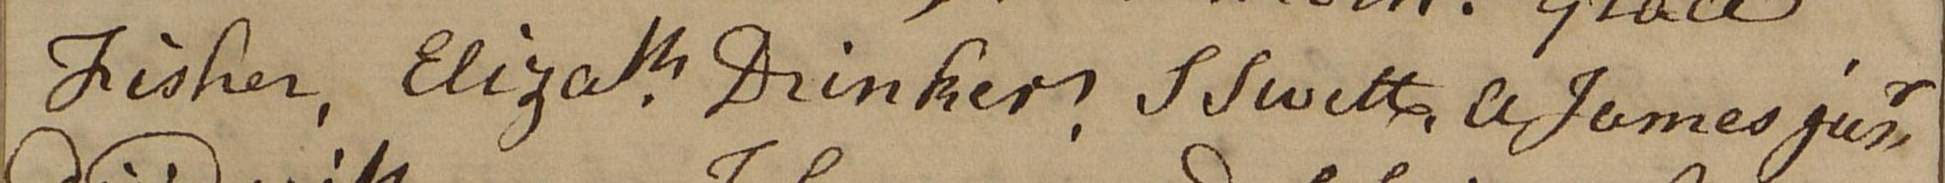Fisher, Eliza^th. Drinker, S Swett, A James jun^r.
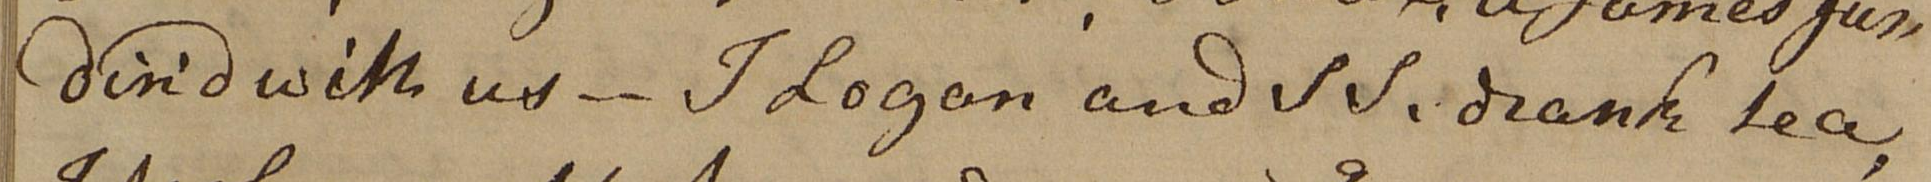din'd with us- T Logon and SS. drank tea,
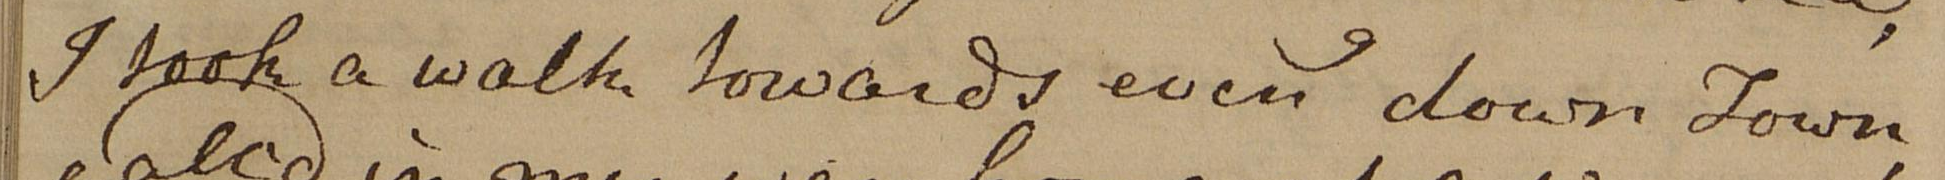I took a walk towards even^g down Town,
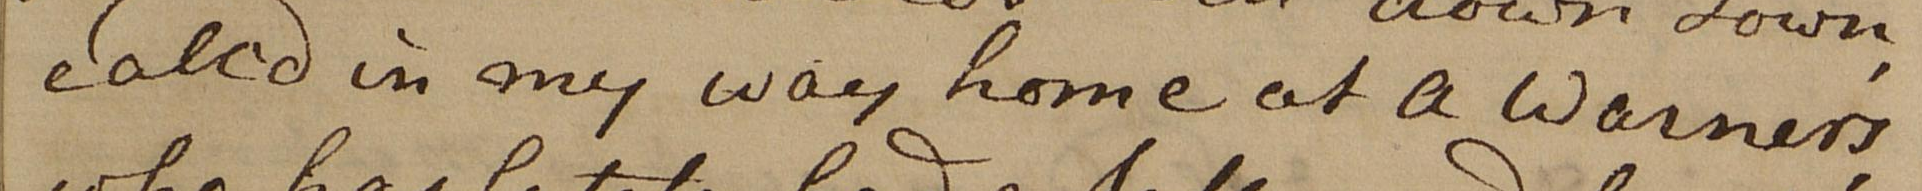call'd in my way home at a Warners,
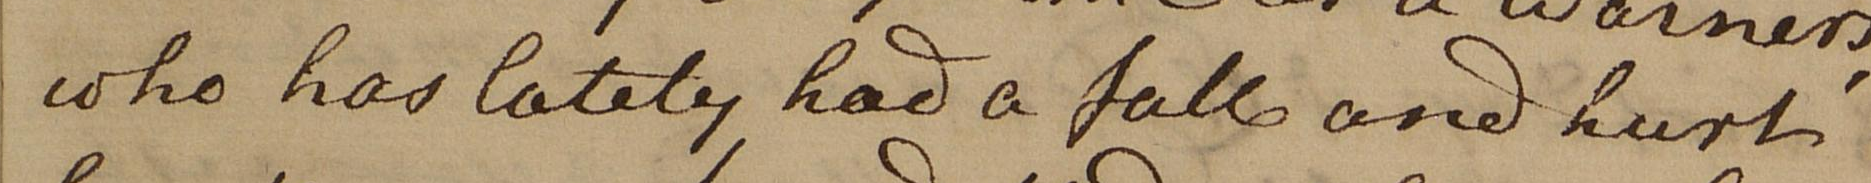who has lately had a fall and hurt
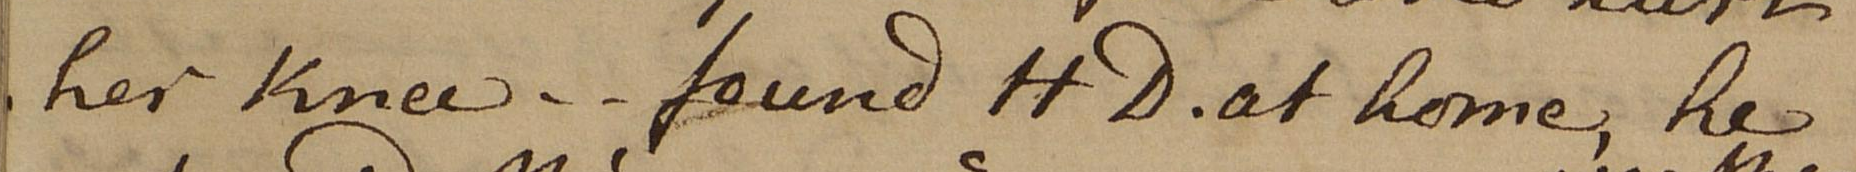her knee-- found HD. at home, he
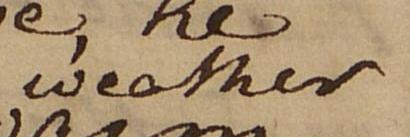weather
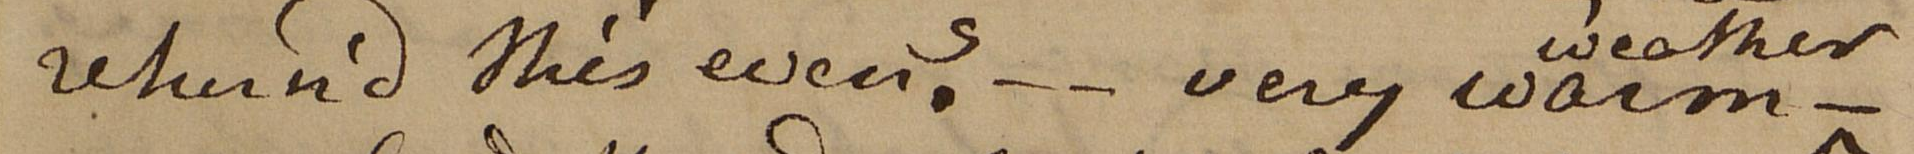return'd this even^g.- very warm ^-
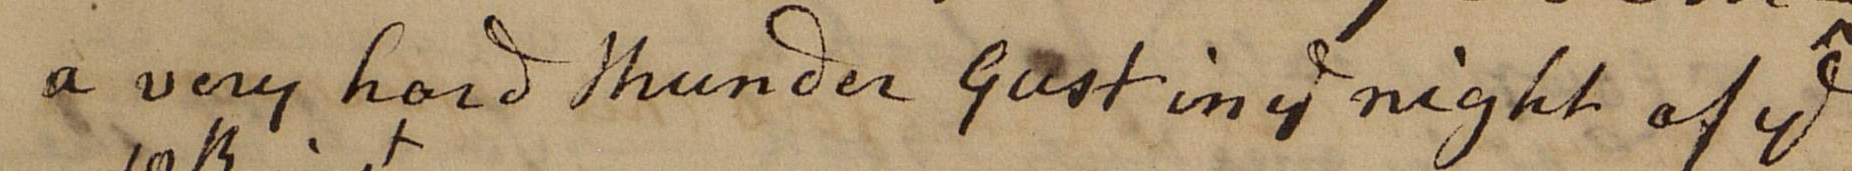a very hard thunder Gust in y^e night of y^e
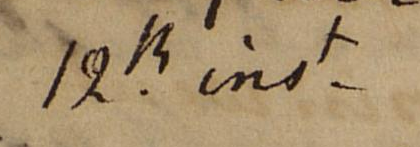12^th. ins^t--
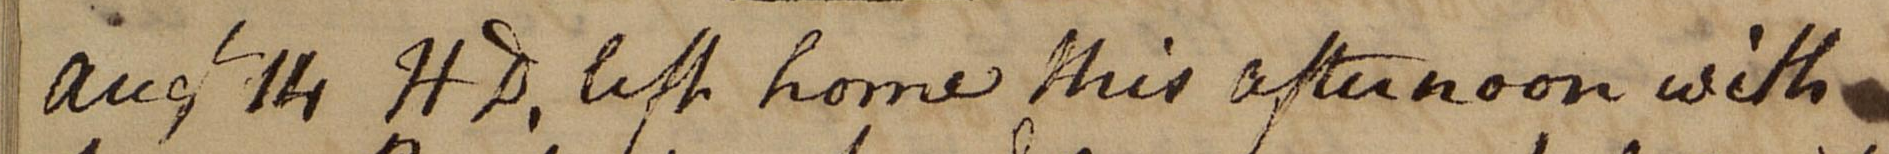Aug^t 14 HD. left home this afternoon with
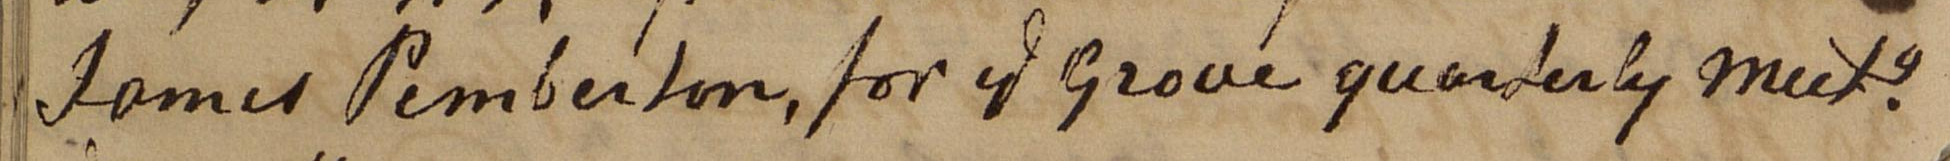James Pemberton, for y^e Grove quarterly meet^g.
